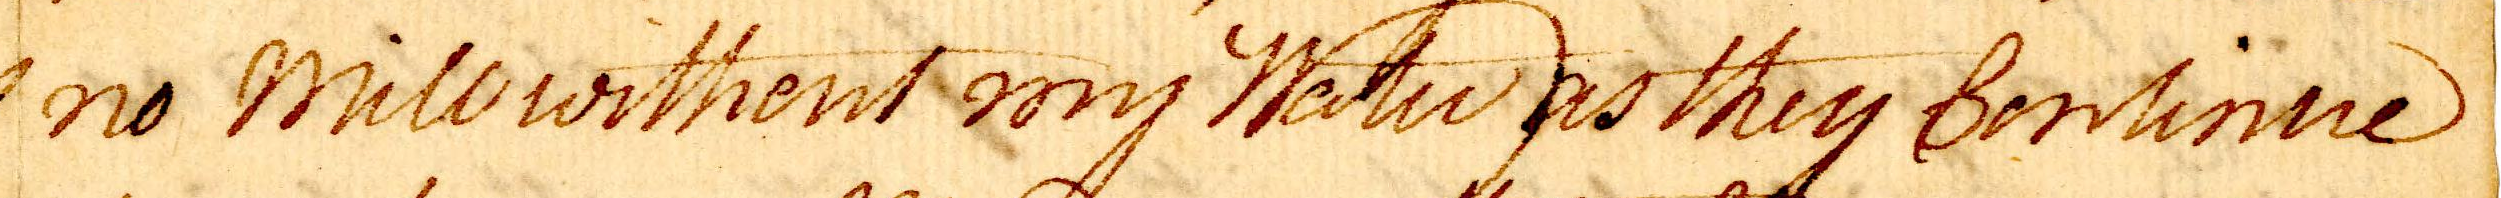no Mill without my Water as they Continue
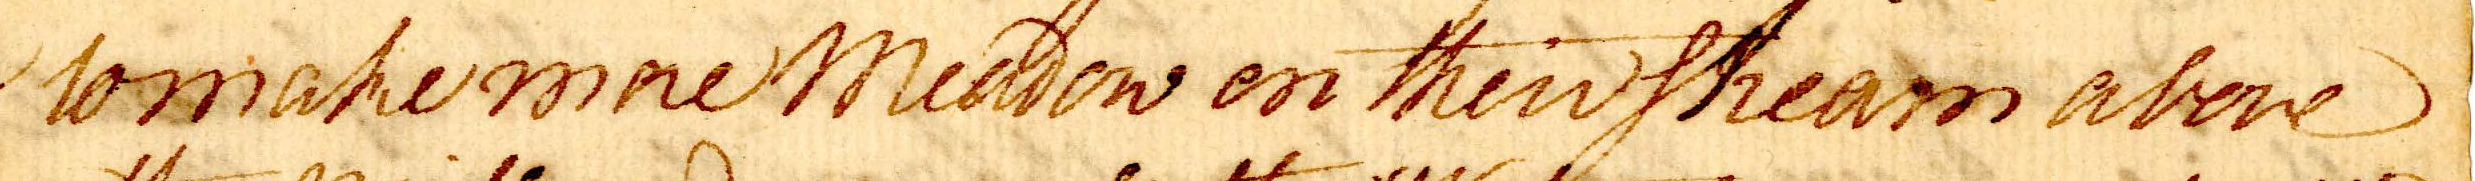to make more Meadow on their stream above
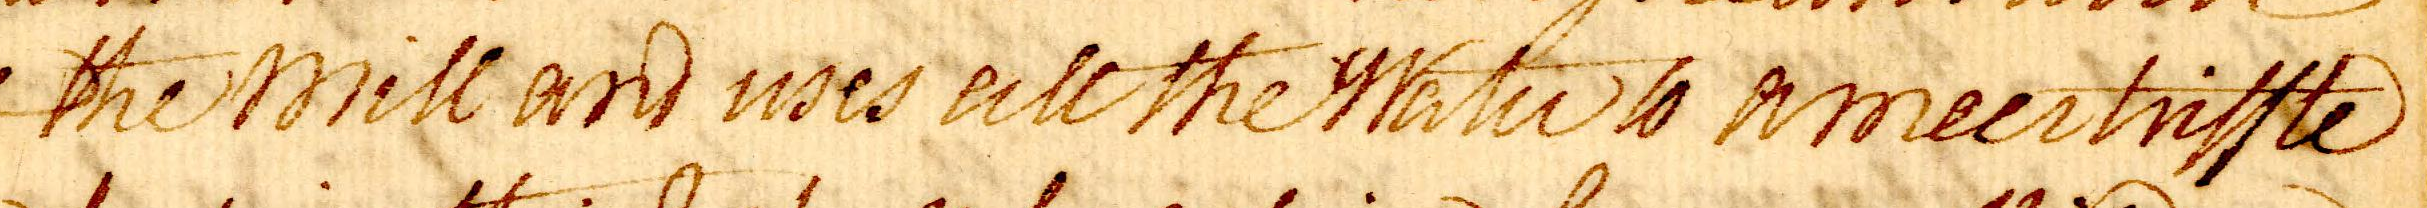the Mill and uses all the Water to a meer triffle
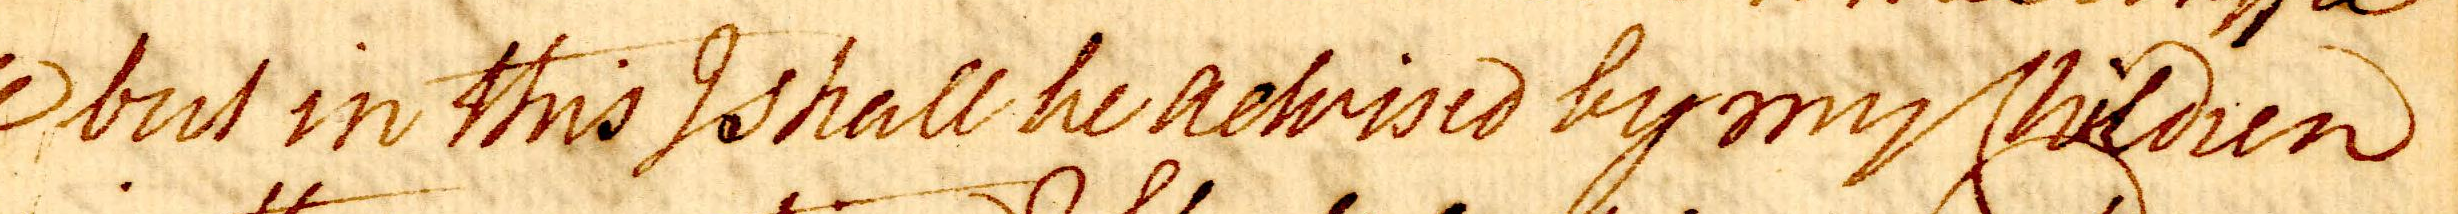but in this I shall be advised by my Children
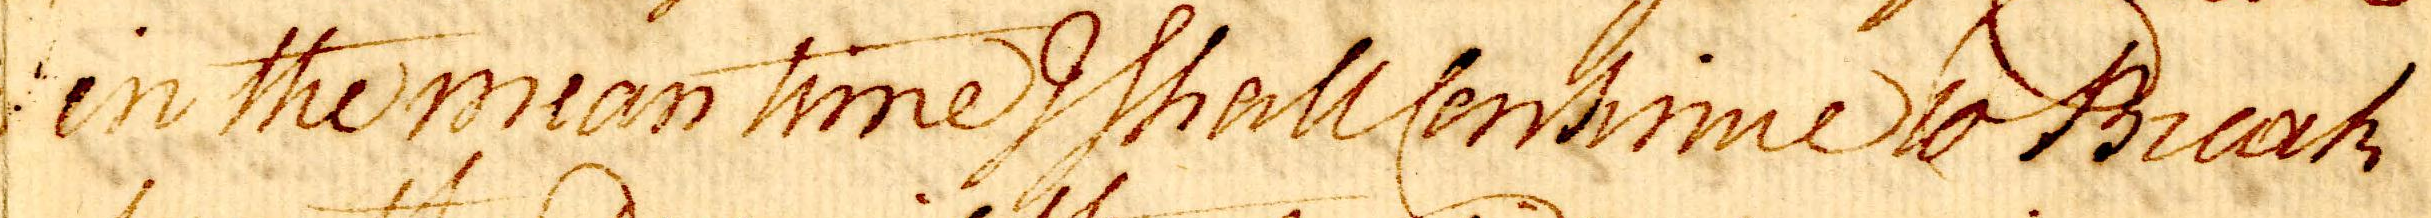in the mean time I shall Consime to Break
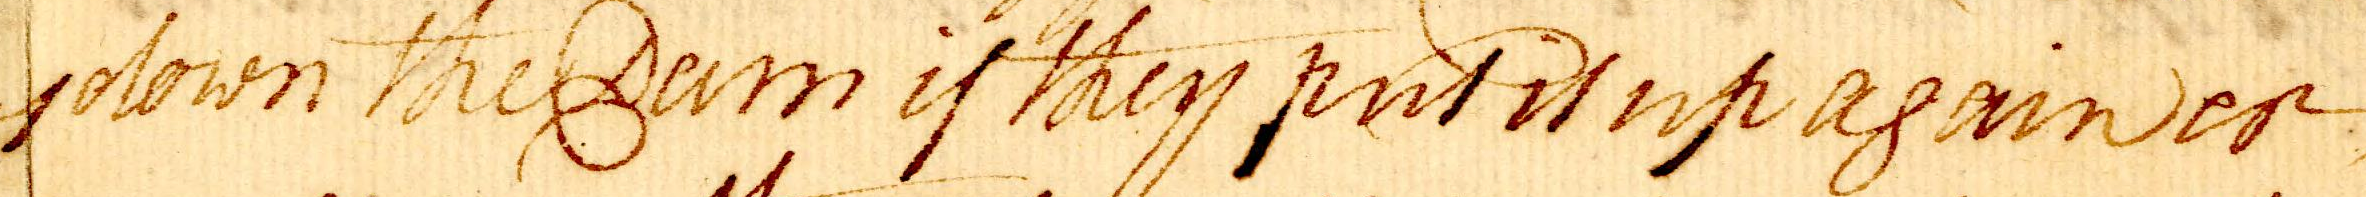down the Dam if they put it up again or
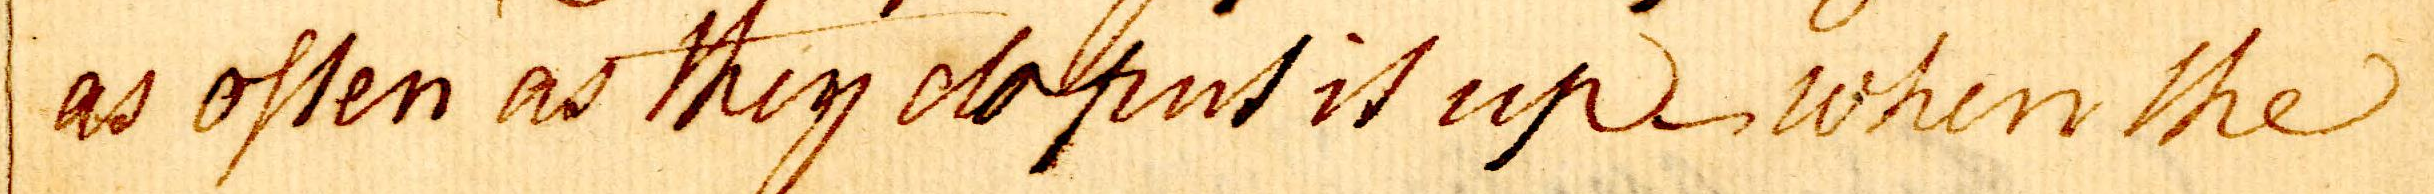as often as they do put it up. when the
